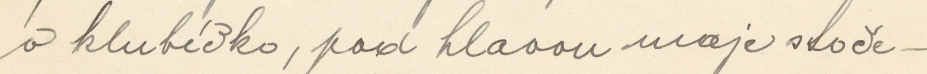v klubíčko, pod hlavou maje stoče-
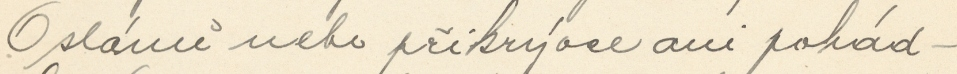O slámě nebo přikrývce ani pohád-
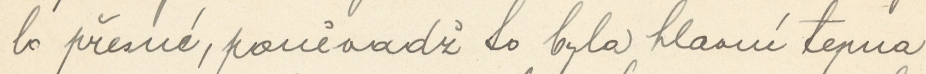lo přesné, poněvadž to byla hlavní tepna
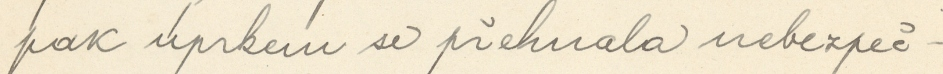pak úprkem se přehnala nebezpeč-
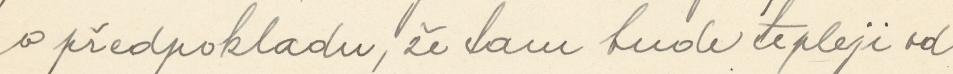v předpokladu, že tam bude tepleji od
